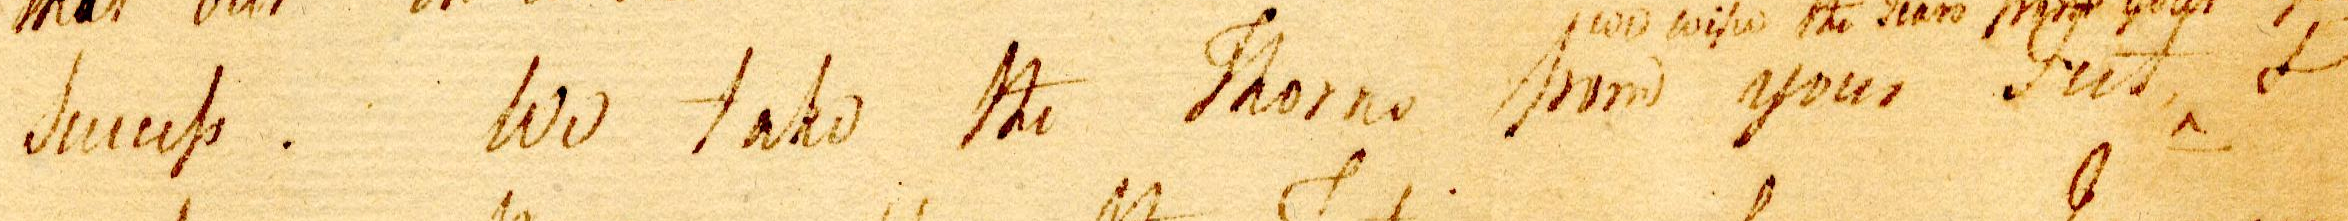Success. We take the Thorns from your Feet ^ &
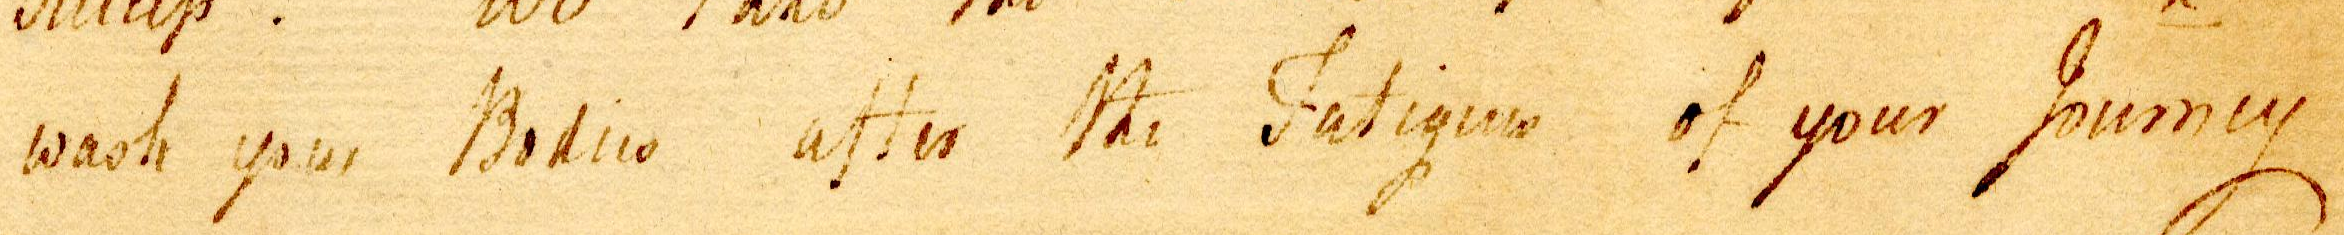wash your Bodies after the Fatigues of your Journey.
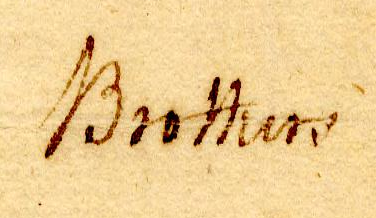Brothers
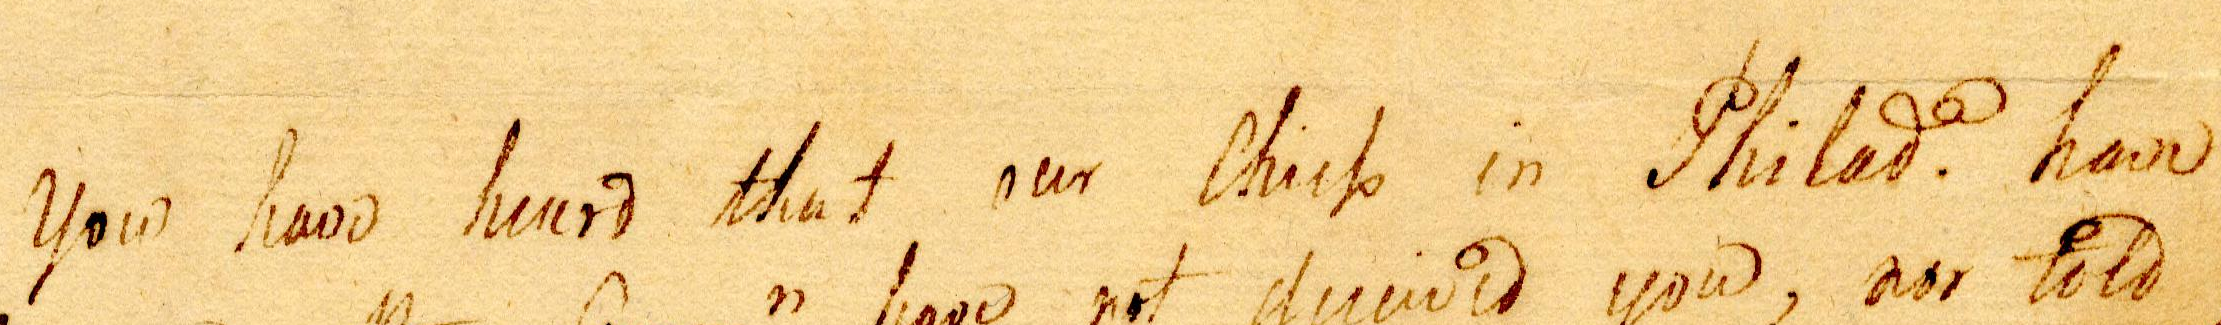You have heard that our Chiefs in Philad^a. have
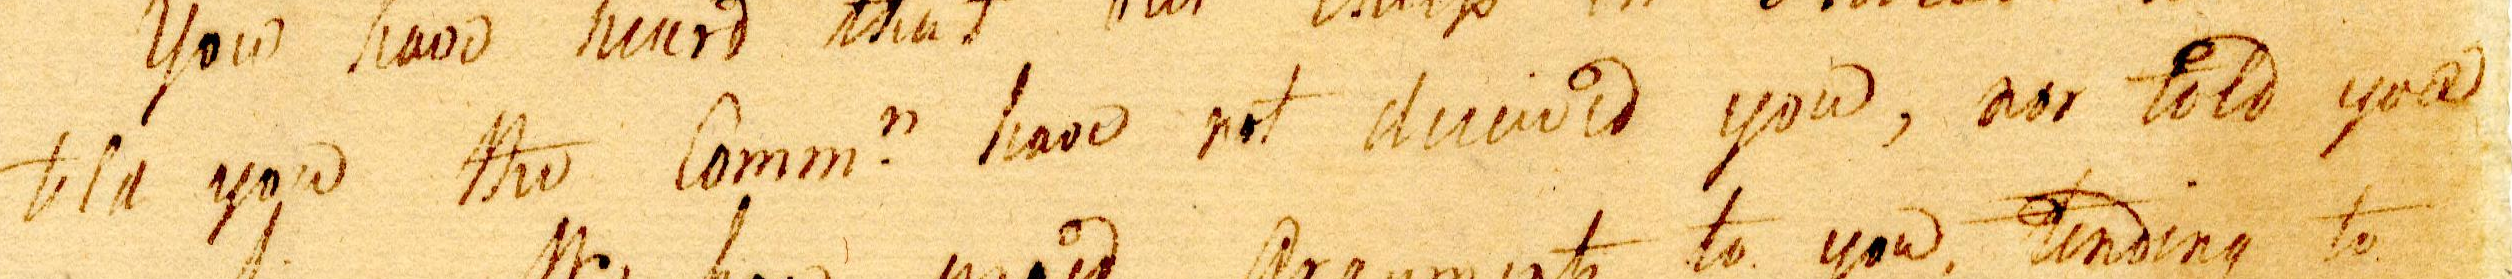told you the Comm^r. have not deceived you, nor told you
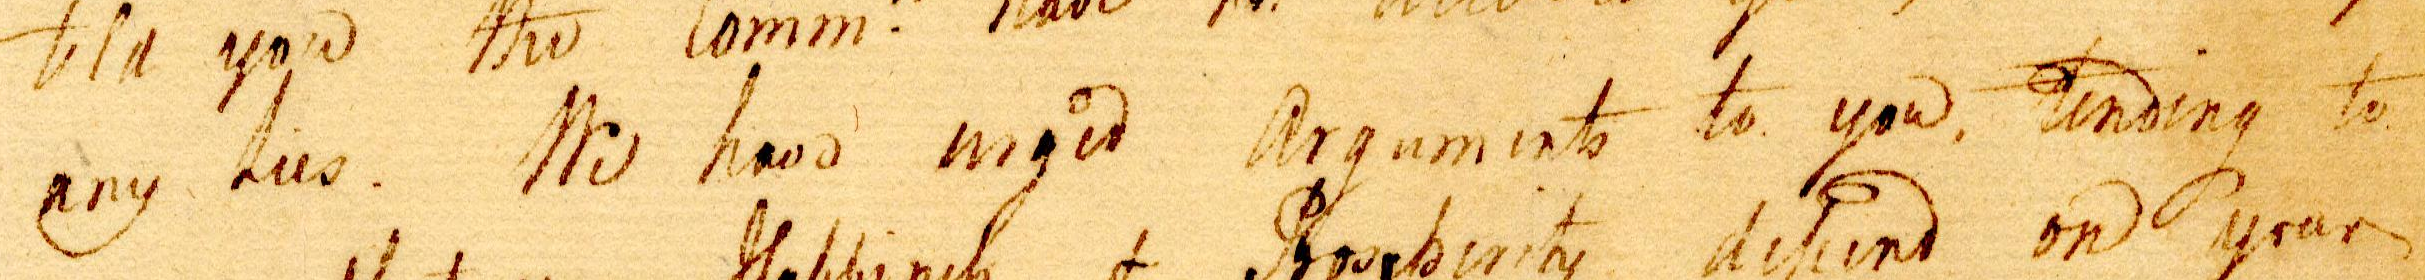any Lies. We have waged Arguments to you, tending to
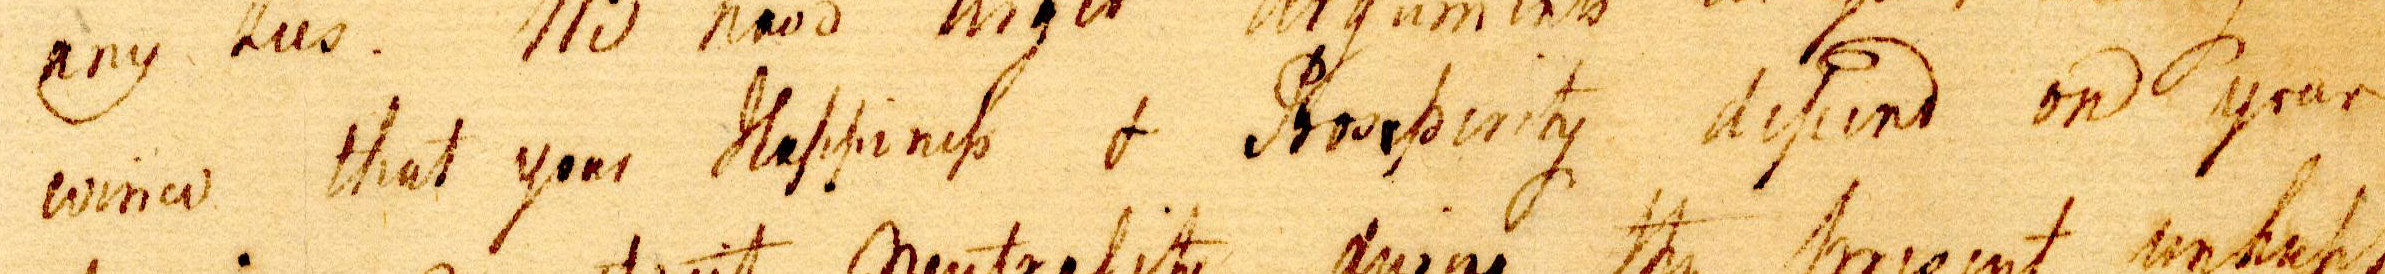evince that your Happiness & Prosperity depend on your
